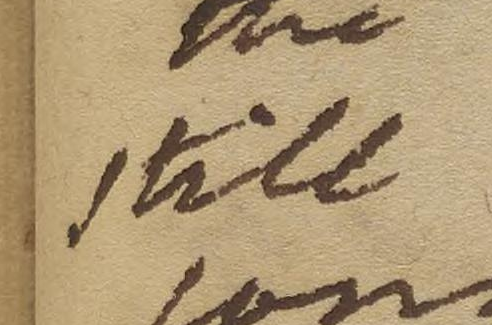still
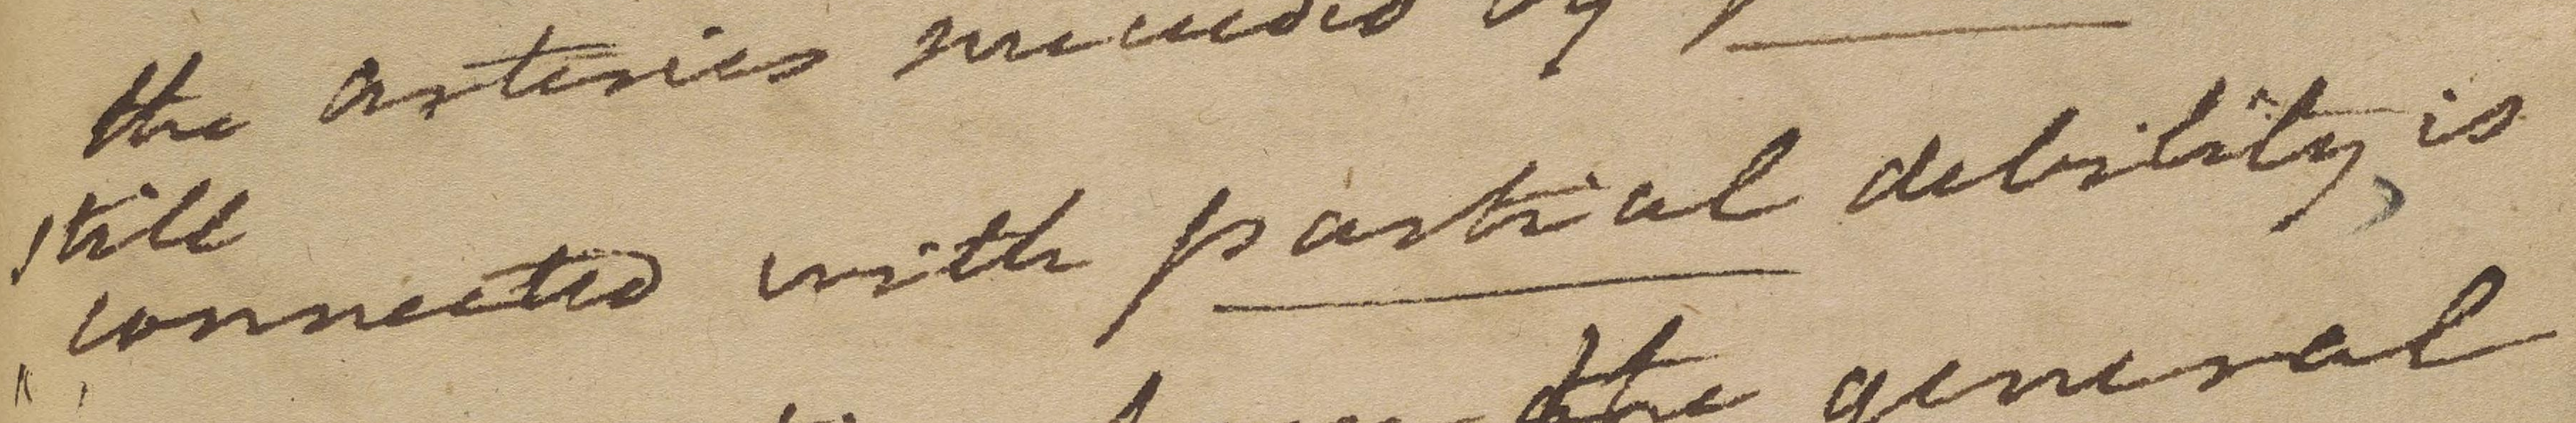connected with partial debility, is
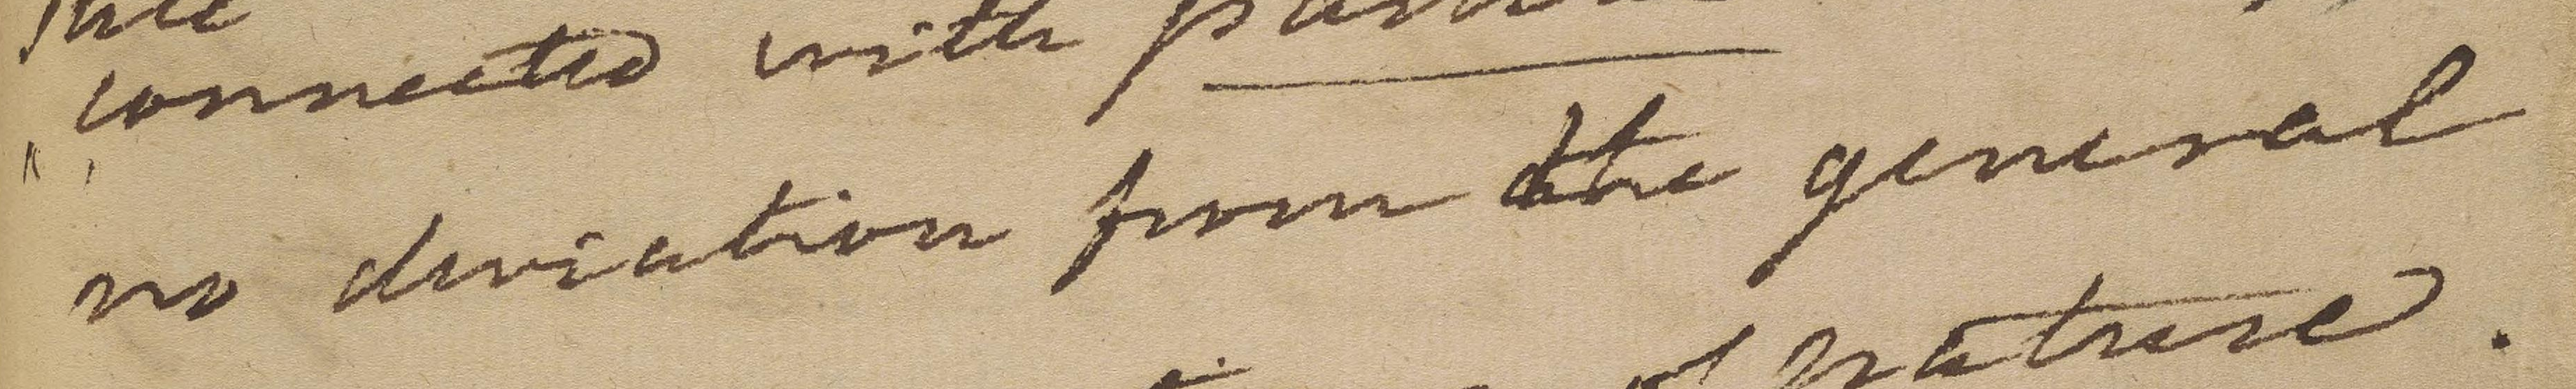no deviation from the general
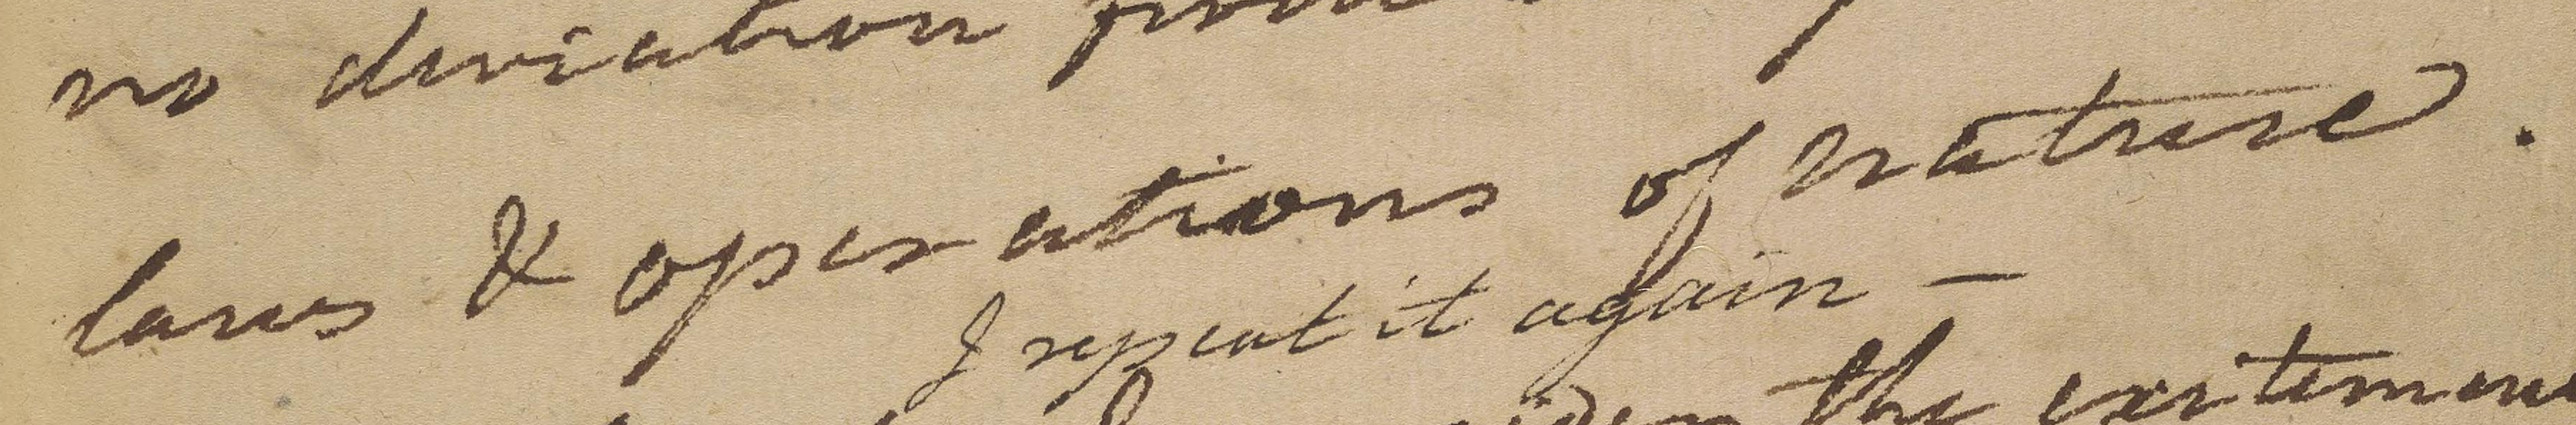laws & operations of nature.
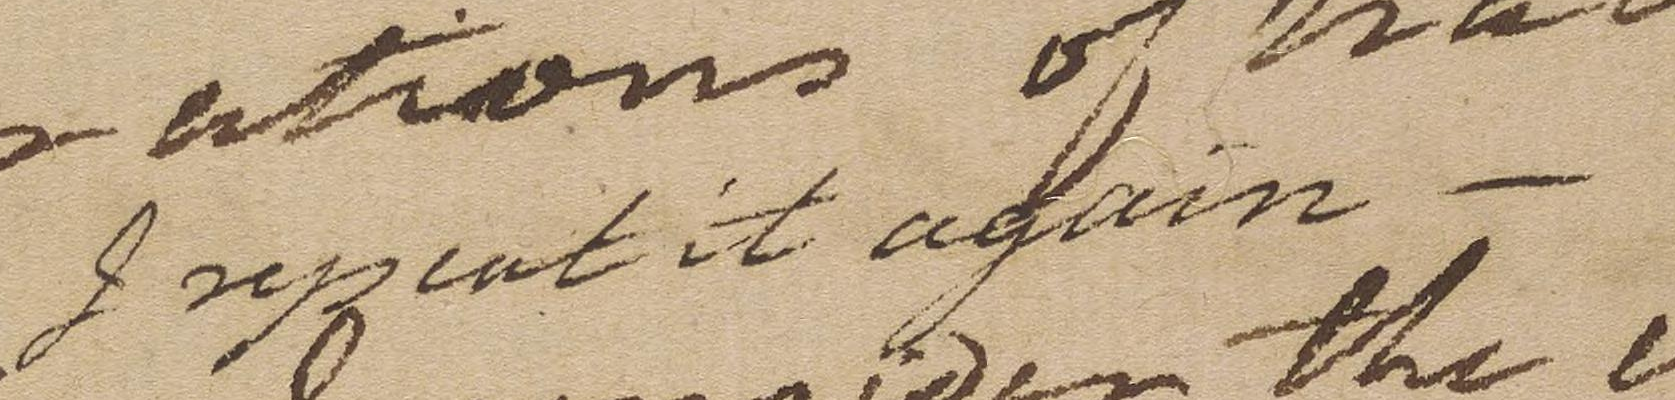I repeat it again,
